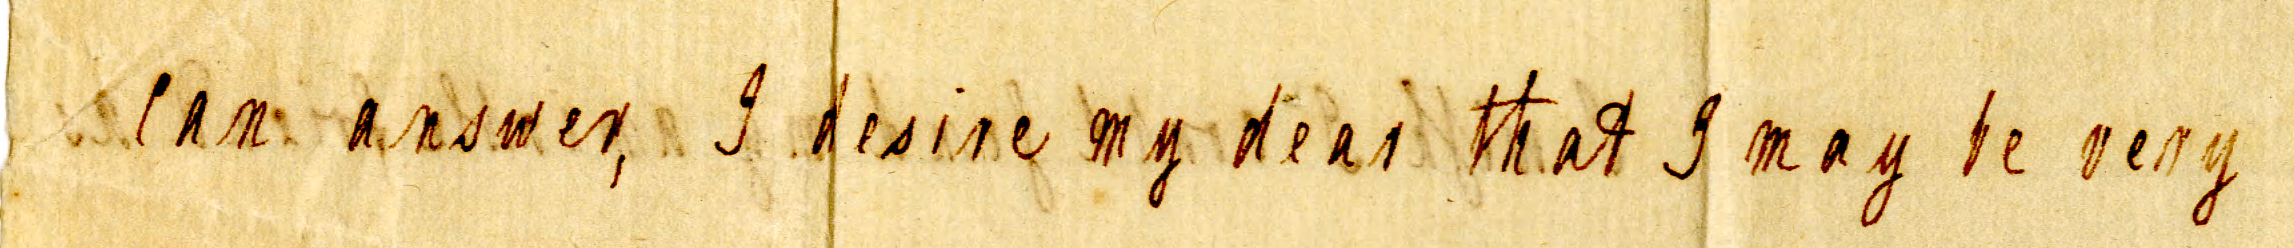can answer, I desire my dear that I may be very
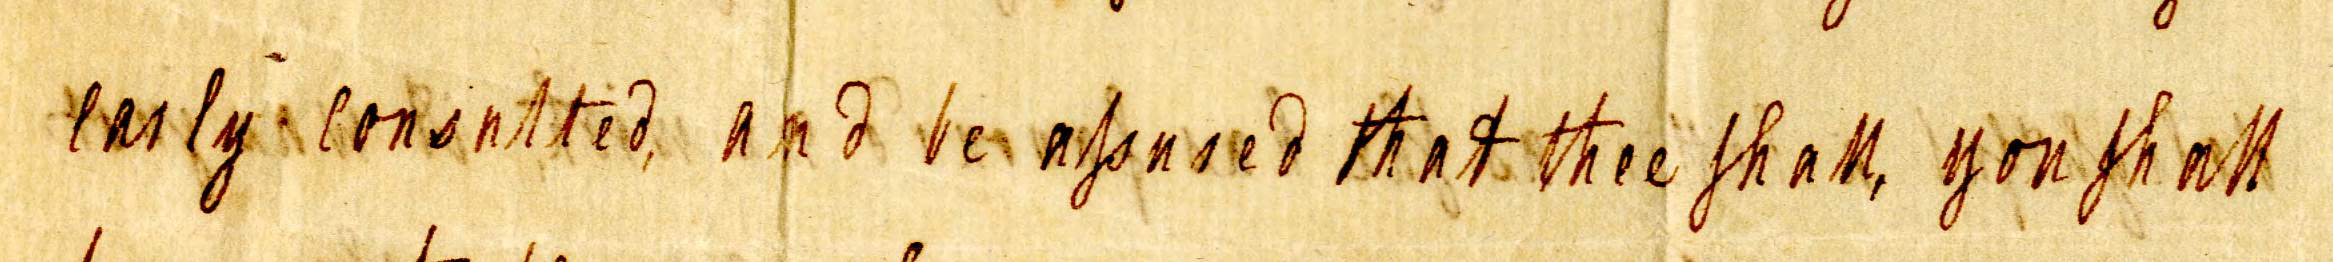early consulted and be assured that thee shall, you shall
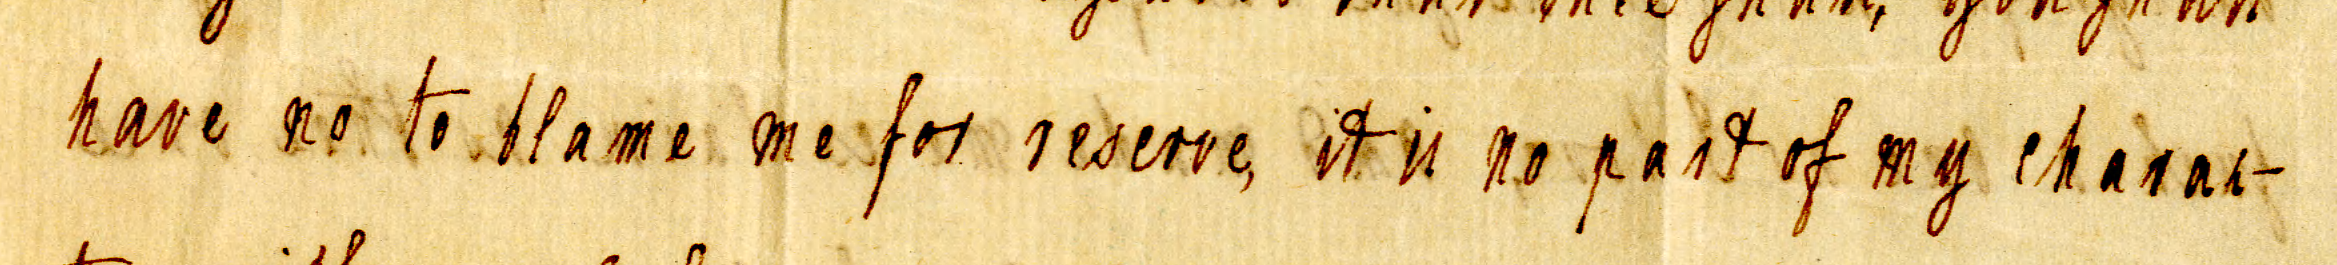have no to blame me for reserve, it is no part of my charac-
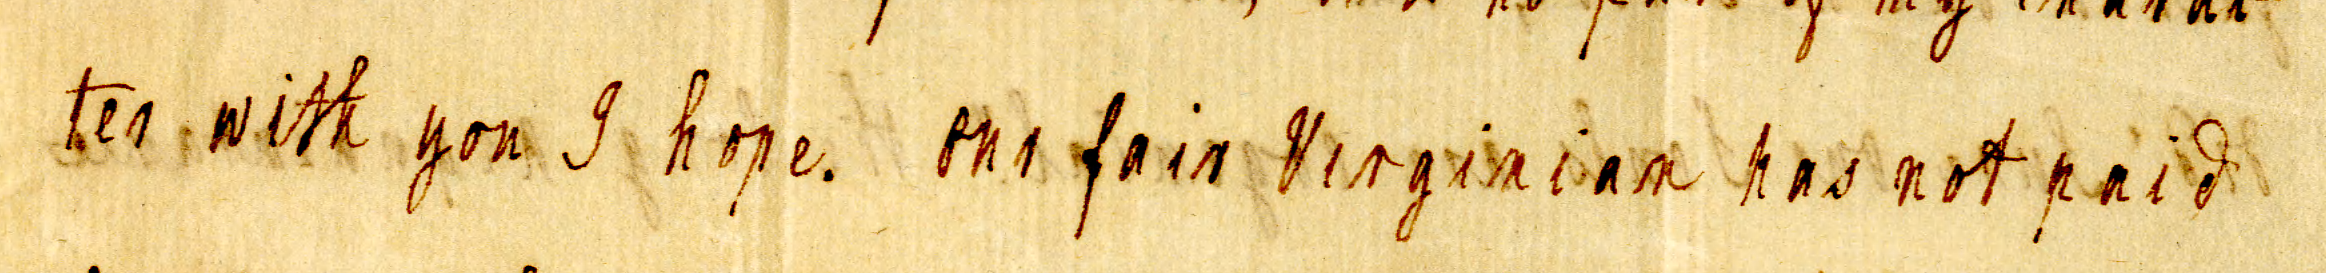ter with you I hope. one fair Virginian has not paid
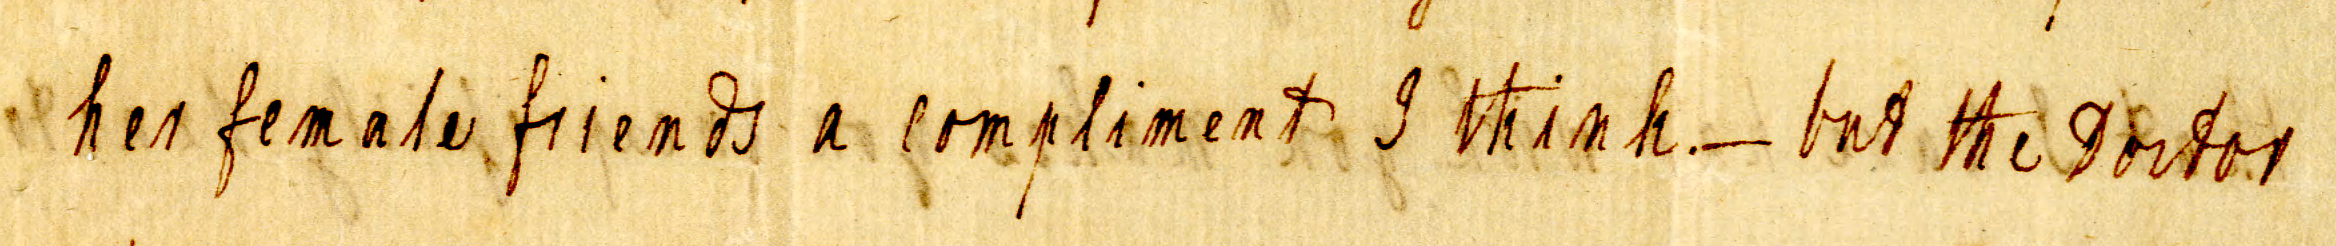her female friends a compliment I think.- but the Doctor
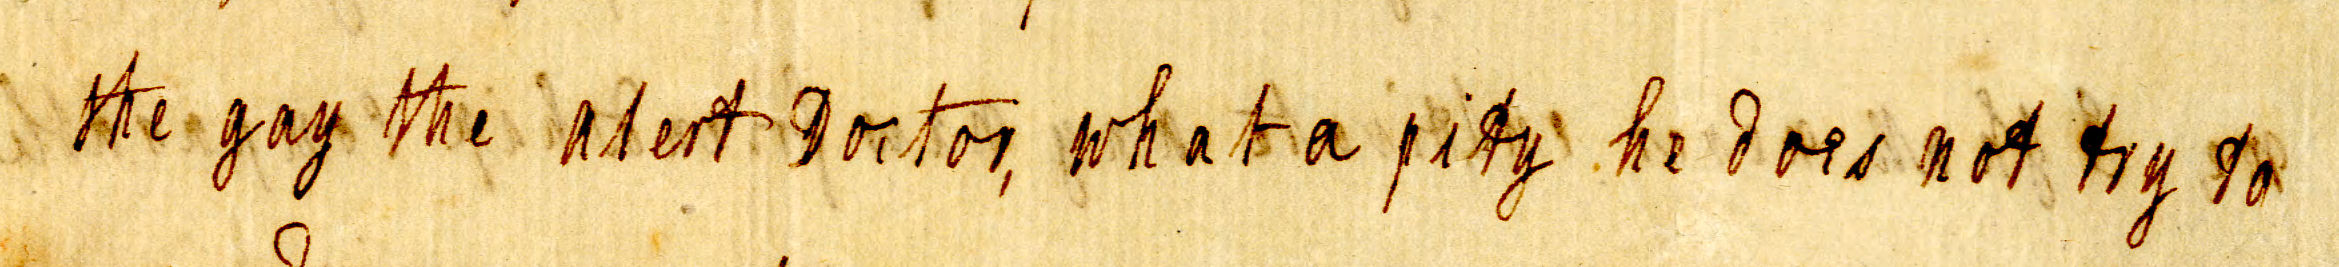the gay the alert Doctor, what a pity he does not try to
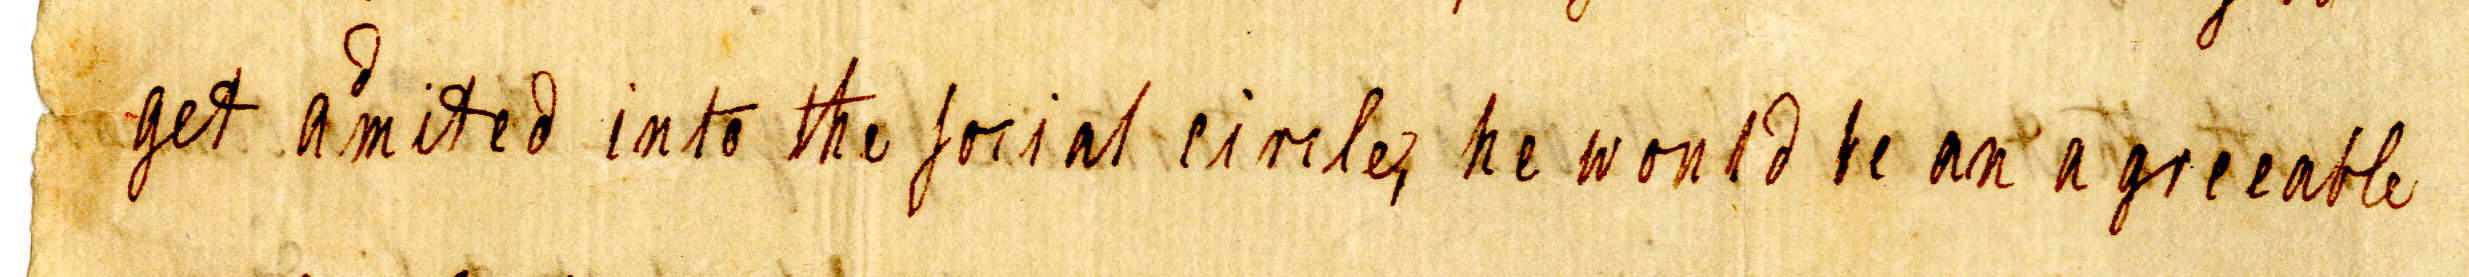get a^dmited into the social circle he would be an agreeable
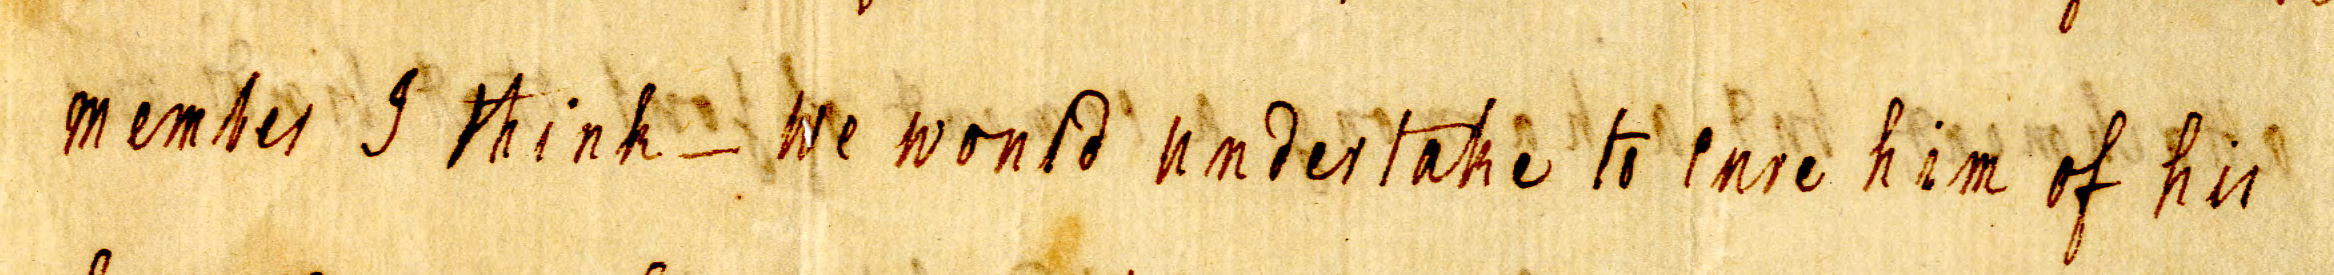member I think- we would undertake to cure him of his
